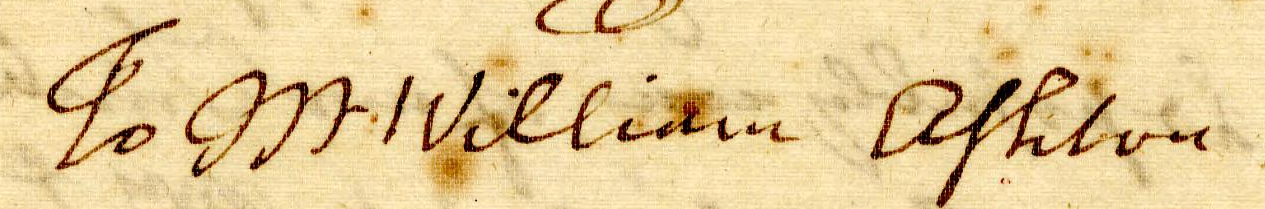To M William Ashton
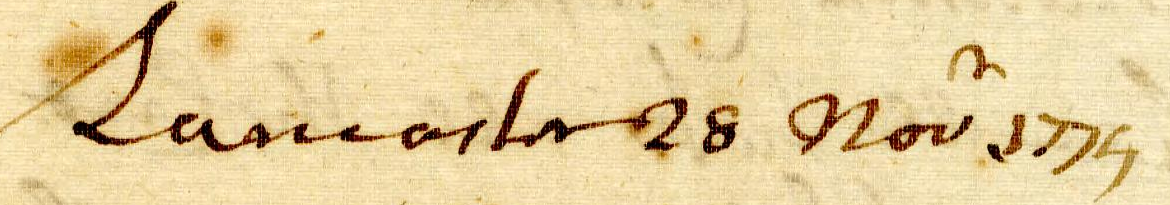Lancaster 28 Nov^r 1774
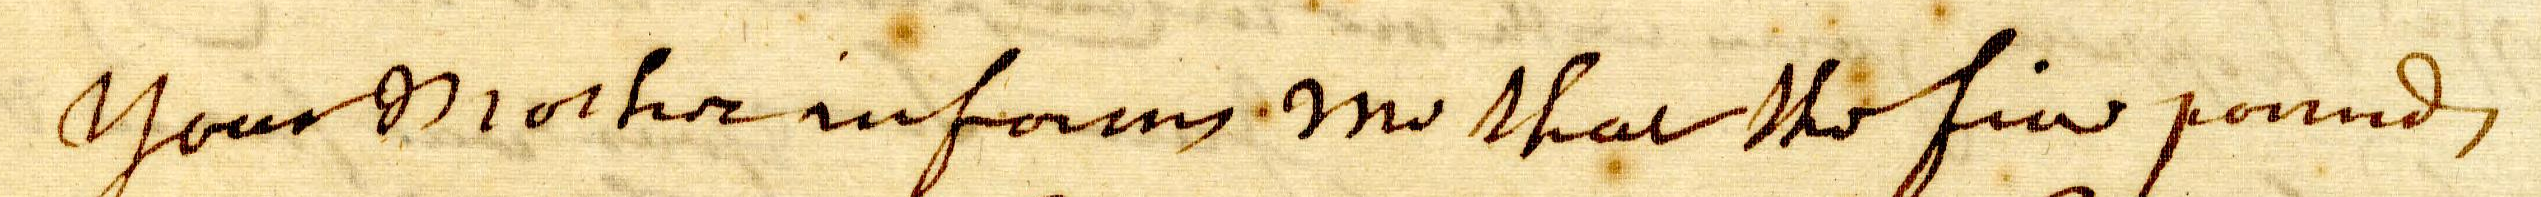Your Mother informs Me that the five pounds
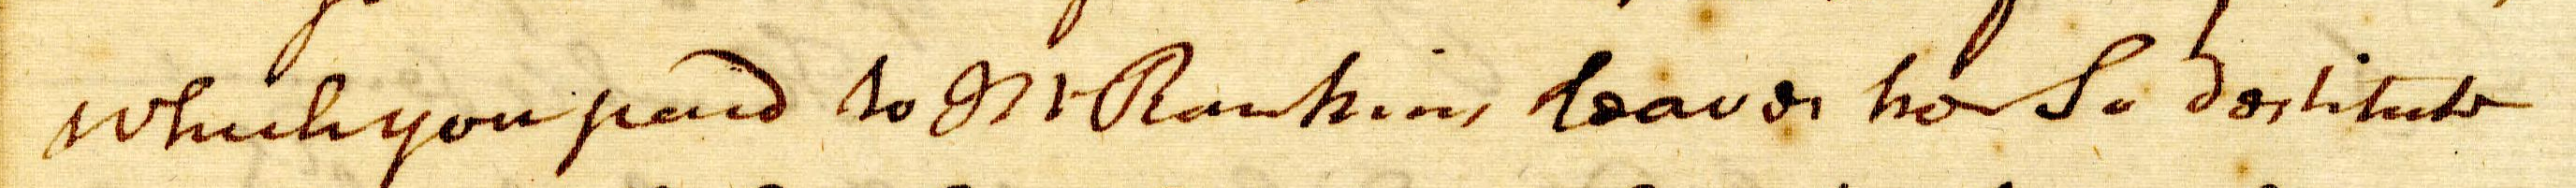which you paid to M Rawkins leaves her so destitute
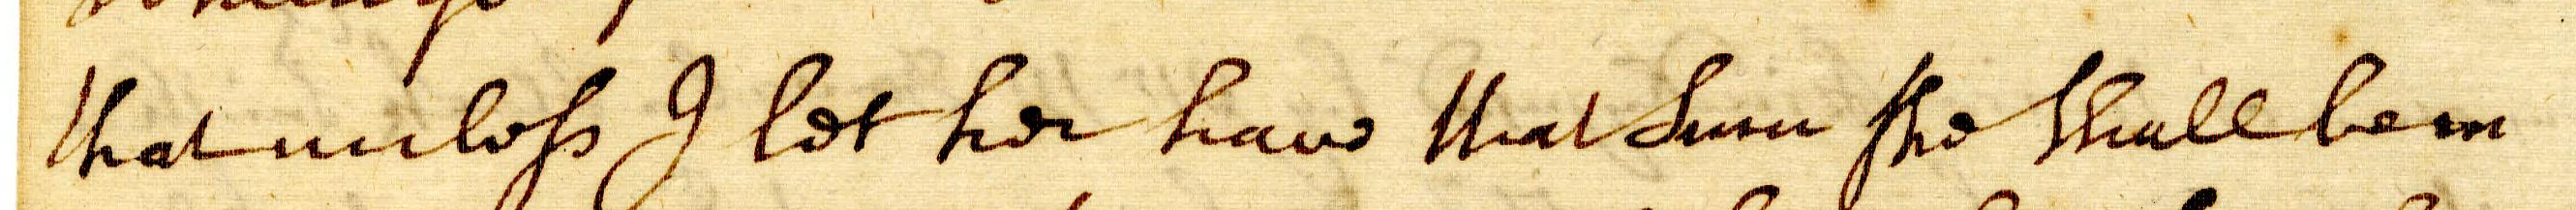that unless I let her have that Sum she Shall be in
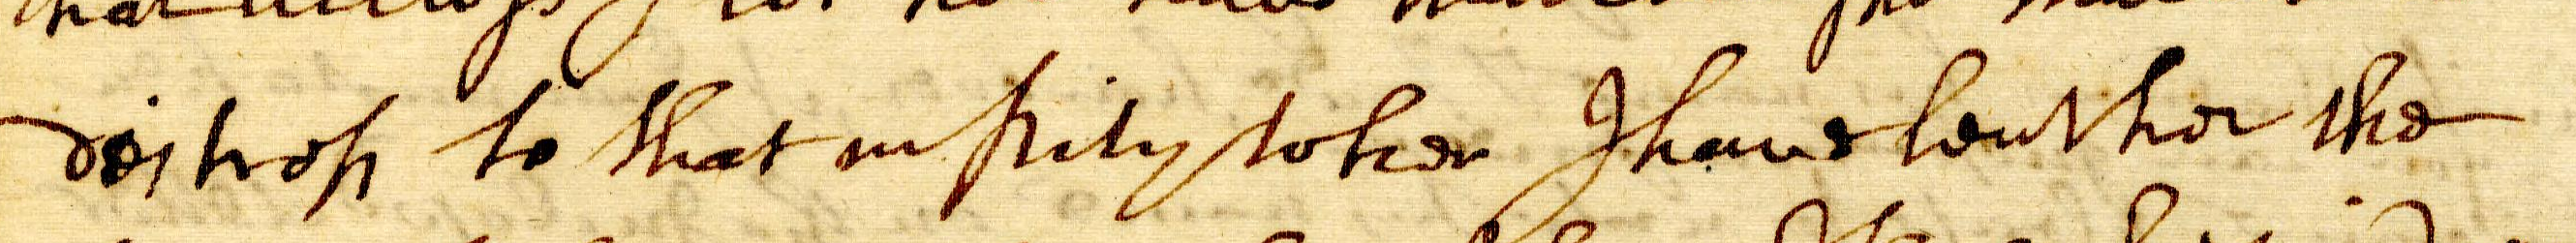distress so that in pity to her I have lent her the
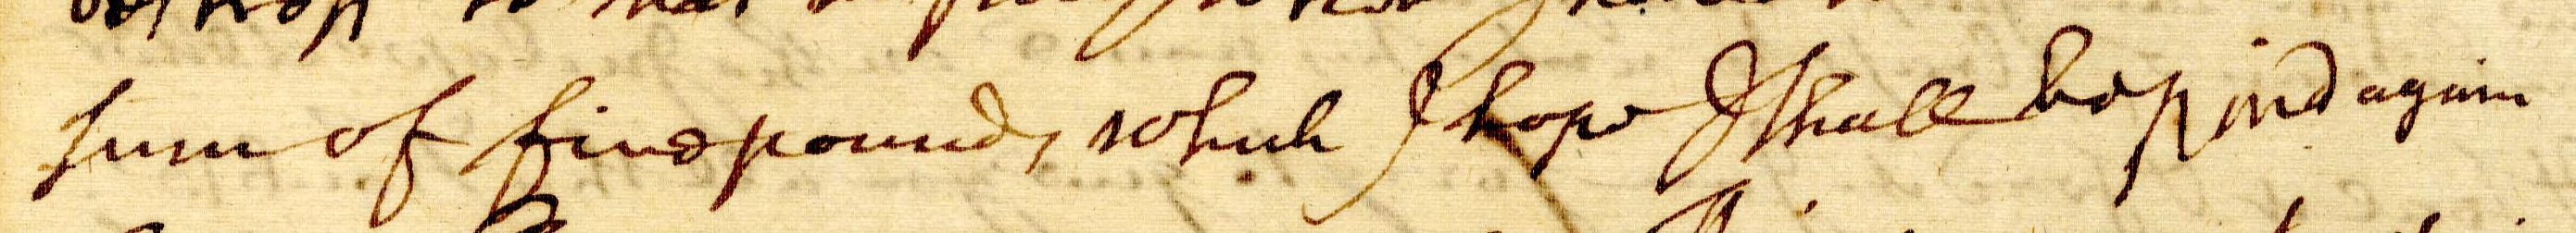sum of five pounds, which I hope I shall be paid again
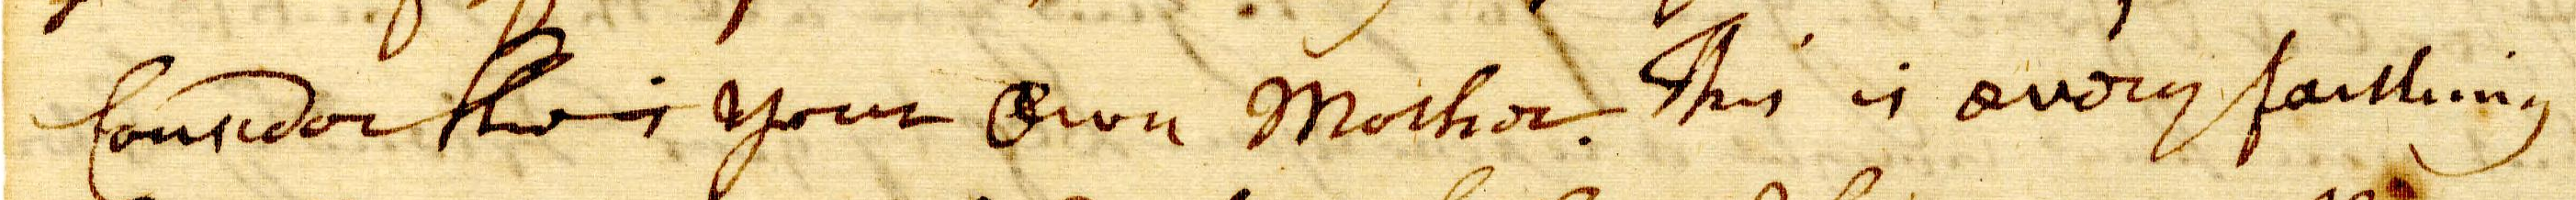Consider she is Your Own Mother. This is every farthing
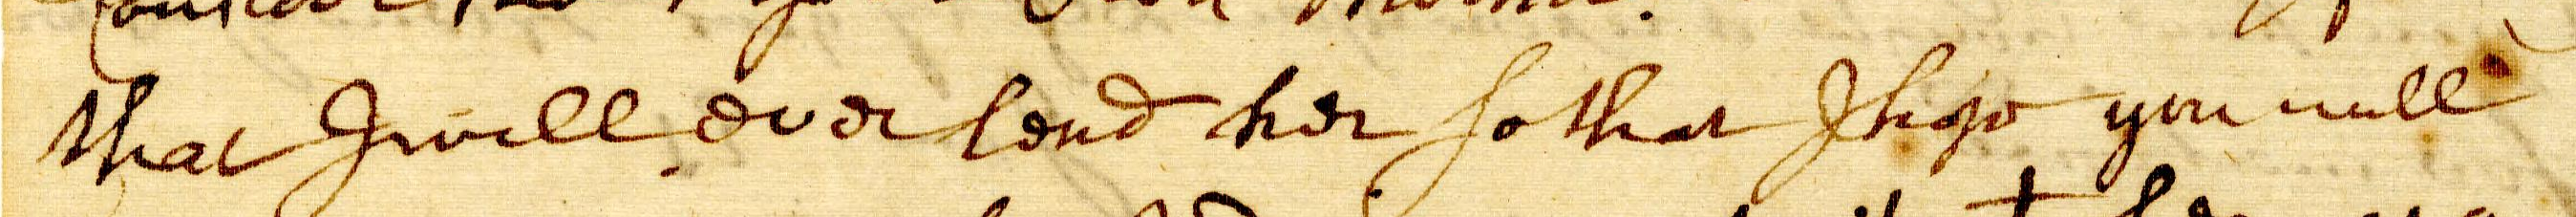that I will over lend her so that I hope you will
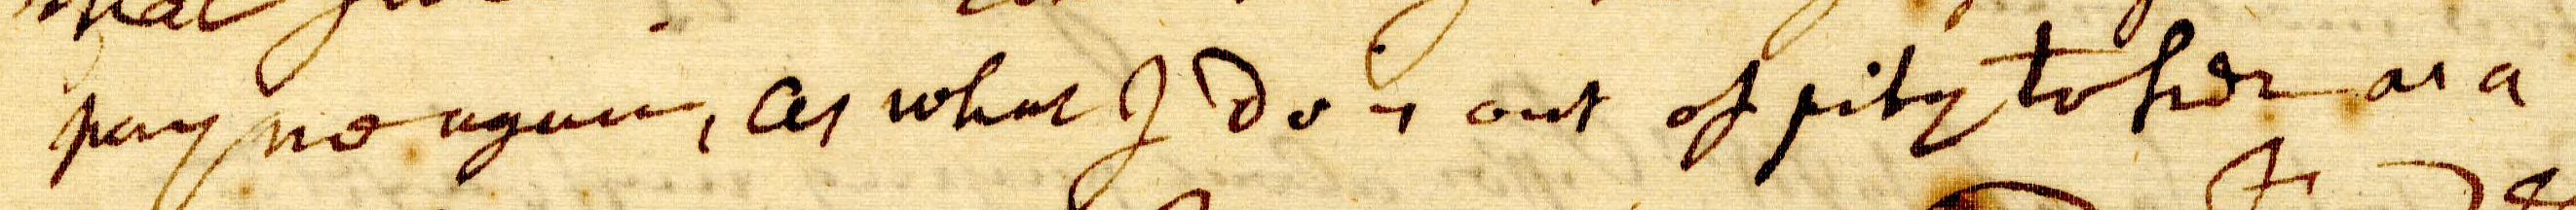pay me again, As what I do is out of pity to her as a
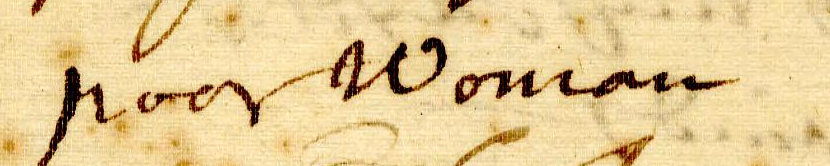poor Woman
